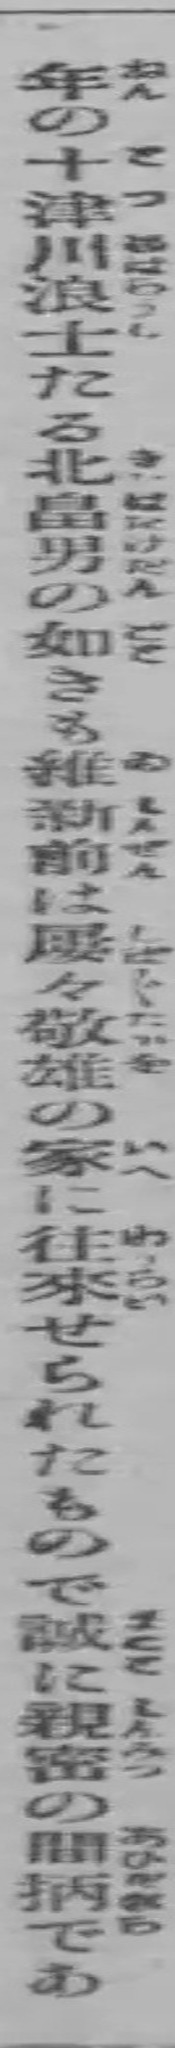年の十津川浪士なる北畠男の如きも維新前は屡々敬雄の家に往来せられたもので誠に親密の間柄であ
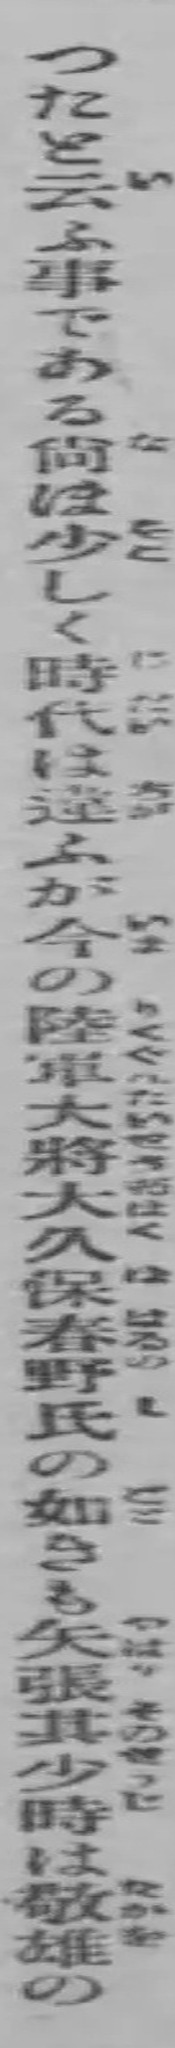つたと云ふ事である尚ほ少しく時代は違ふが今の陸軍大将大久保春野氏の如きも矢張其少時は敬雄の
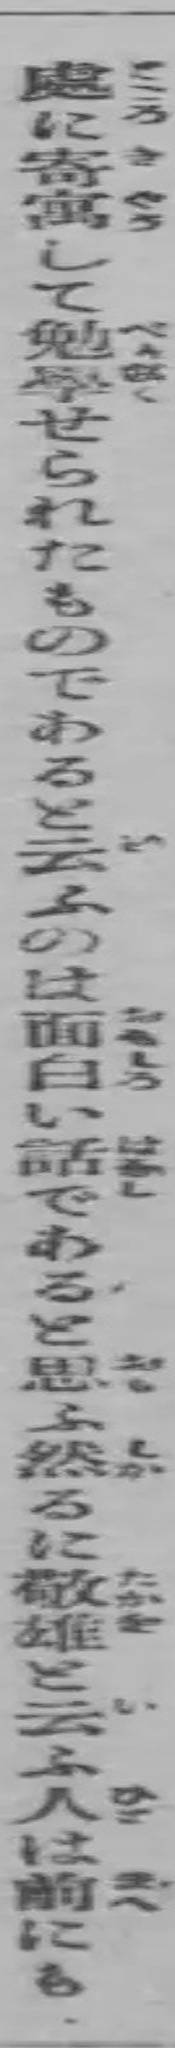処に寄寓して勉学せられたものであると云ふのは面白い話であると思ふ然るに敬雄と云ふ人は前にも
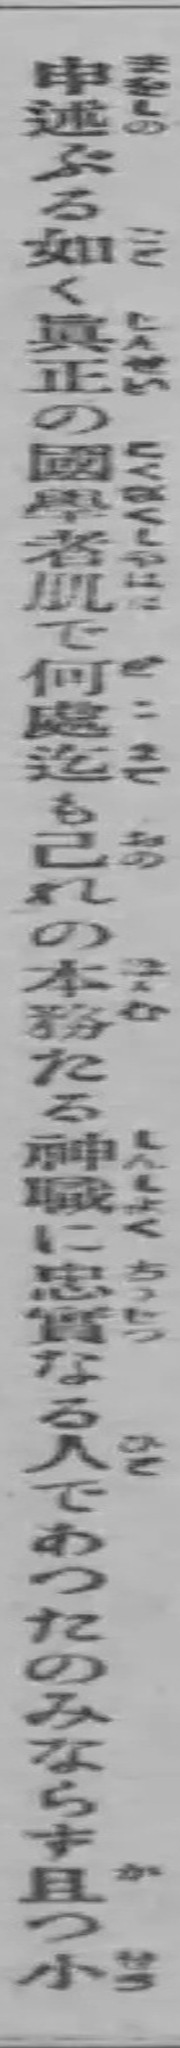申述ぶる如く真正の国学者肌で何処迄も己れの本務たる神職に忠実なる人であつたのみならず且つ小
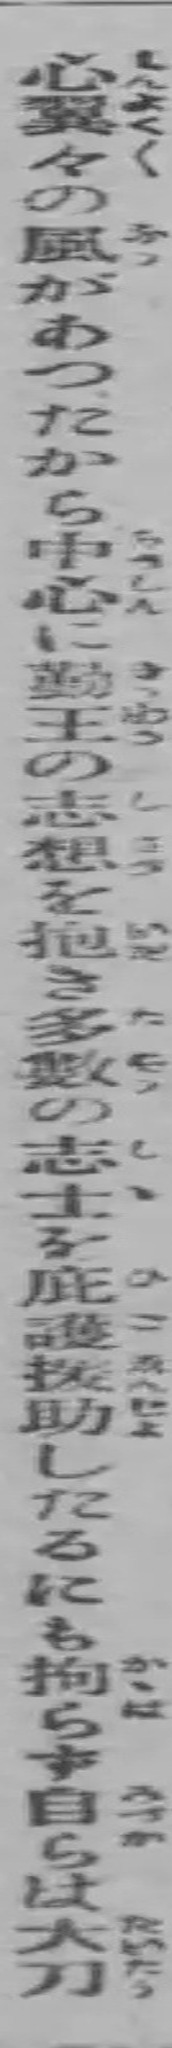心翼々の風があつたから中心に勤王の志想を抱き多数の志士を庇護援助したるにも拘らず自らは大刀
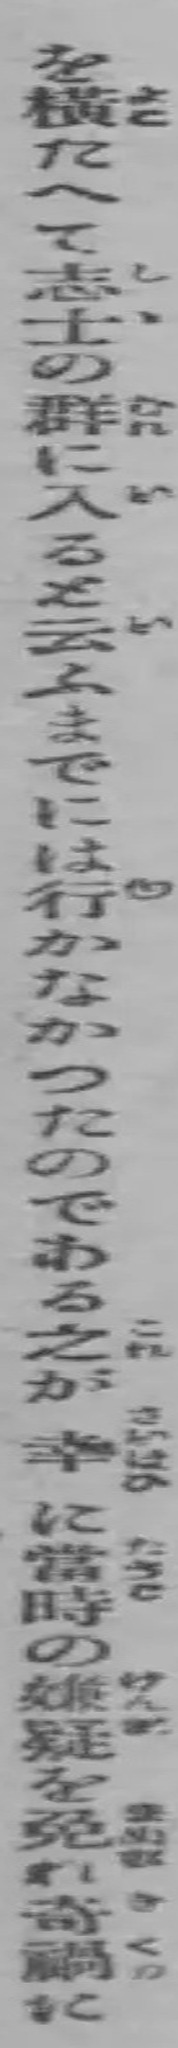を横たへて志士の群に入ると云ふまでには行かなかつたのである之が幸に当時の嫌疑を免れ奇禍に

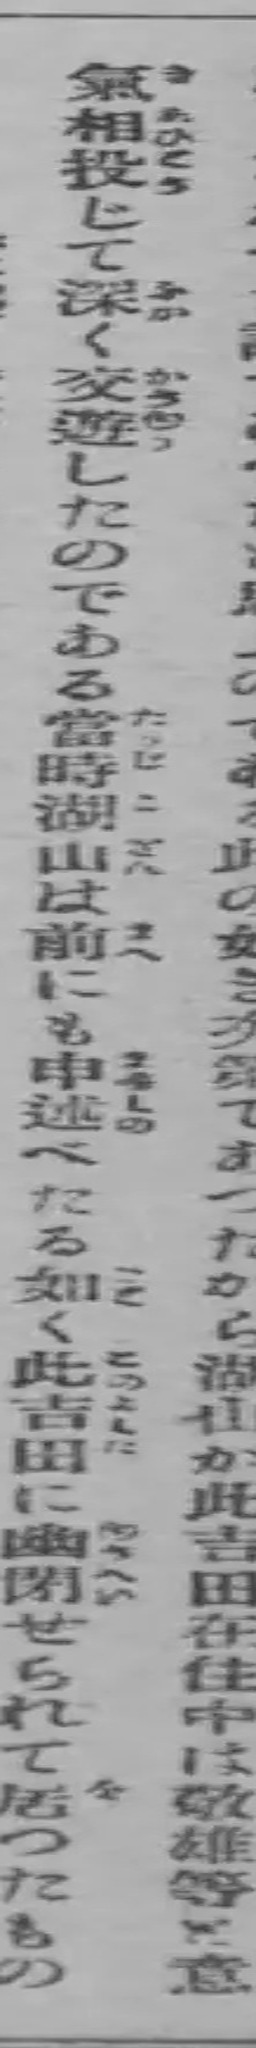気相投じて深く交遊したのである当時湖山は前にも申述べたる如く此吉田に幽閉せられて居つたもの
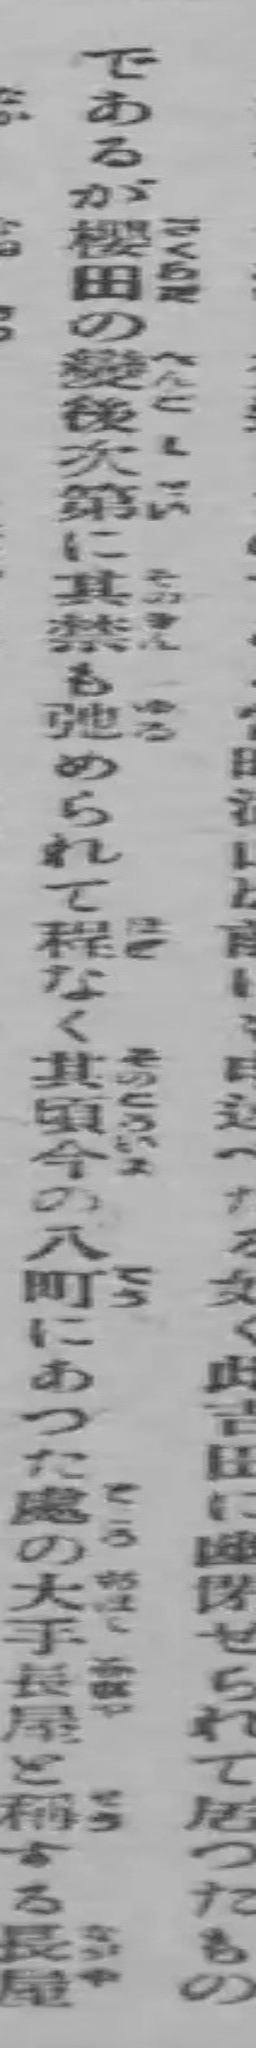であるが桜田の変後次第に其禁も弛められて程なく其頃今の八町にあつた処の大手長屋と称する長屋
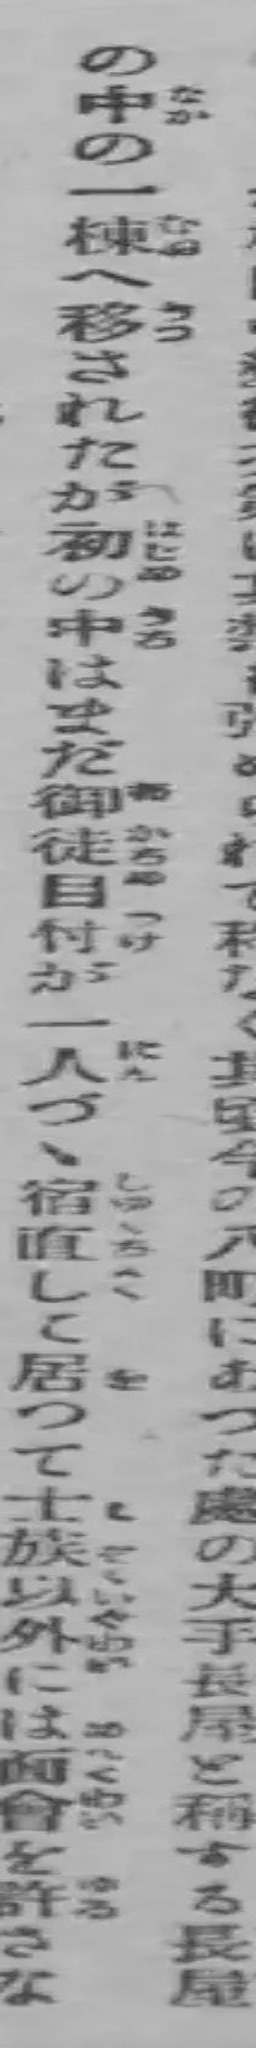の中の一棟へ移されたが初の中はまだ御徒目付が一人づゝ宿直して居つて士族以外には面会を許さな
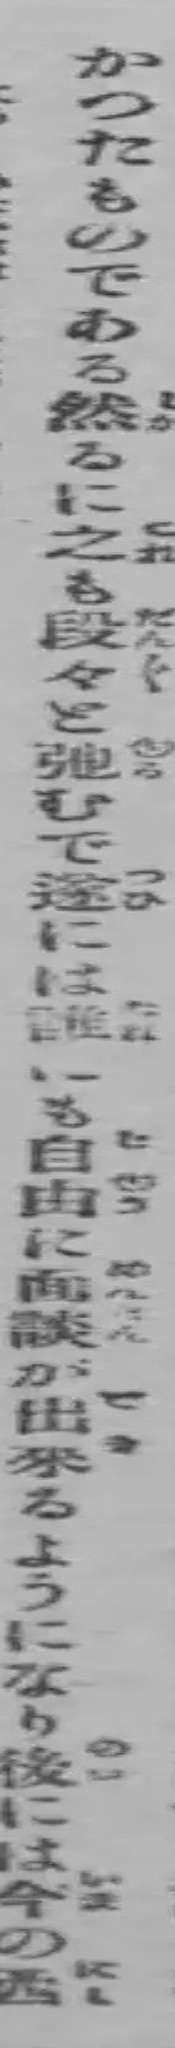かつたものである然るに之も段々と弛むで遂には誰にも自由に面談が出来るようになり後には今の西
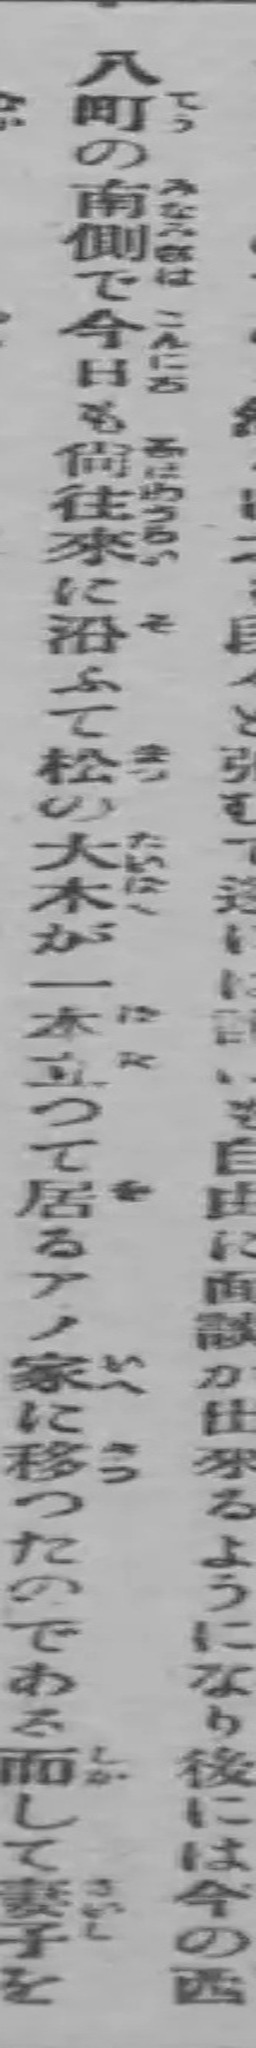八町の南側で今日も尚往来に沿ふて松の大木が一本立つて居るアノ家に移つたのである而して妻子を
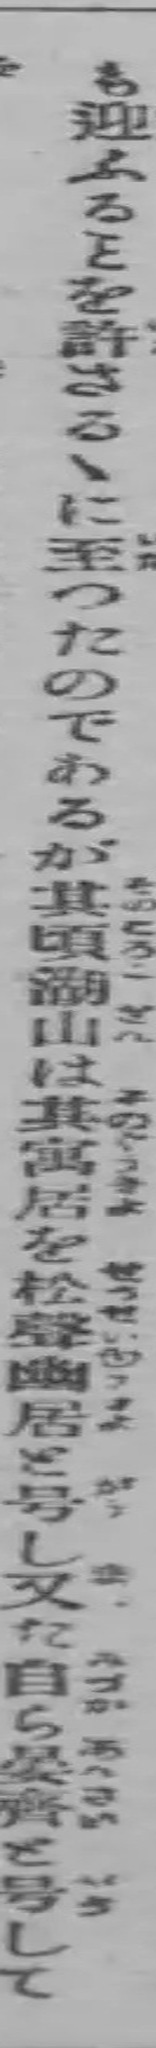も迎ふることを許さるゝに至つたのであるが其頃湖山は其寓居を松聲幽居と号し又た自ら晏斉と号して
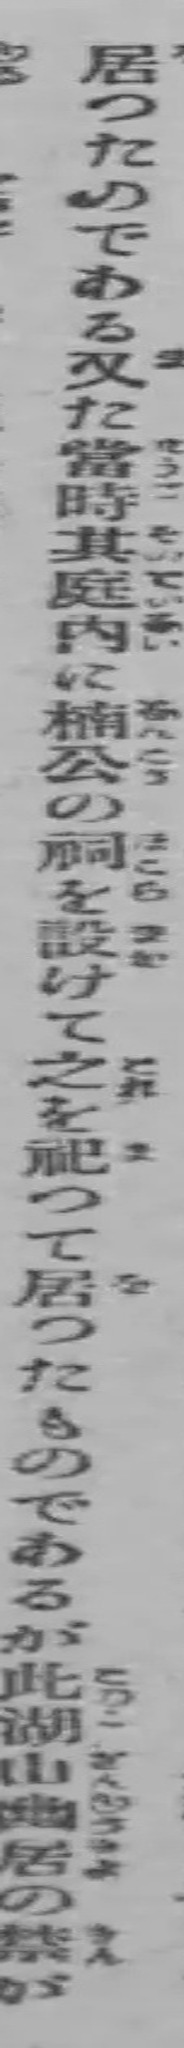楠公の祭祀居つたのである又た当時其庭内に楠公の祠を設けて之を祀つて居つたものであるが此湖山幽居の禁が
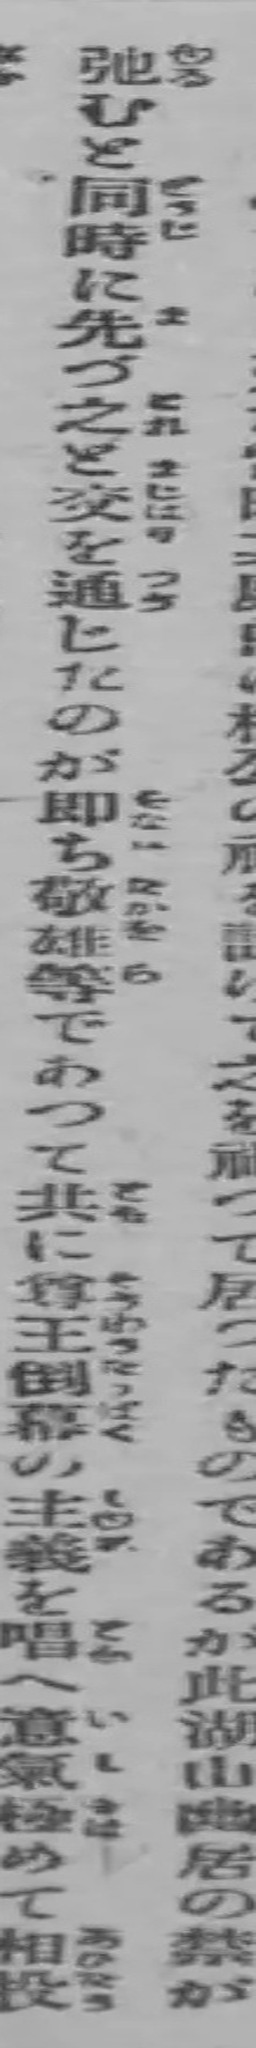弛むと同時に先づ之と交を通じたのが即ち敬雄等であつて共に尊王倒幕の主義を唱へ意気極めて相投
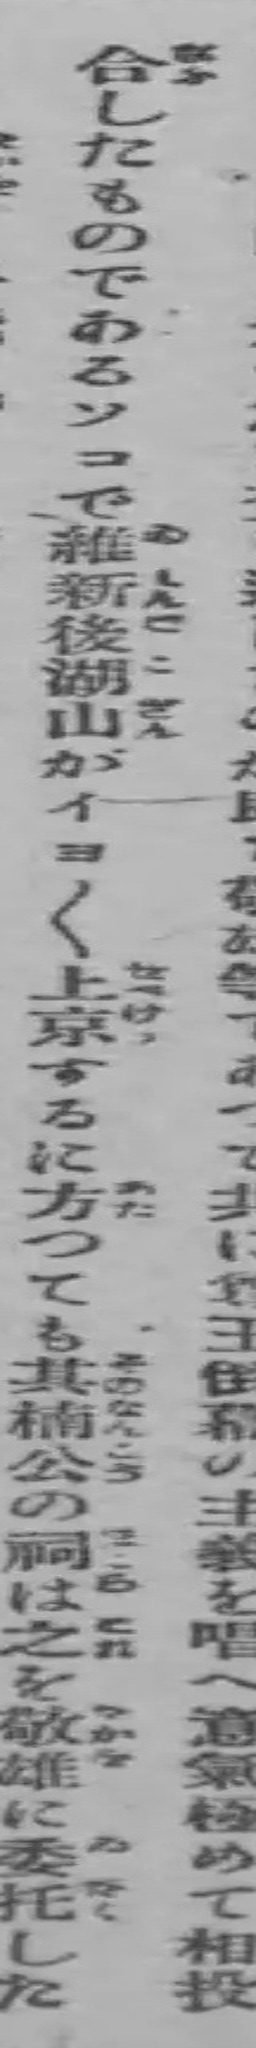合したものであるソコで維新後湖山がイヨ〳〵上京するに方つても其楠公の祠は之を敬雄に委托した
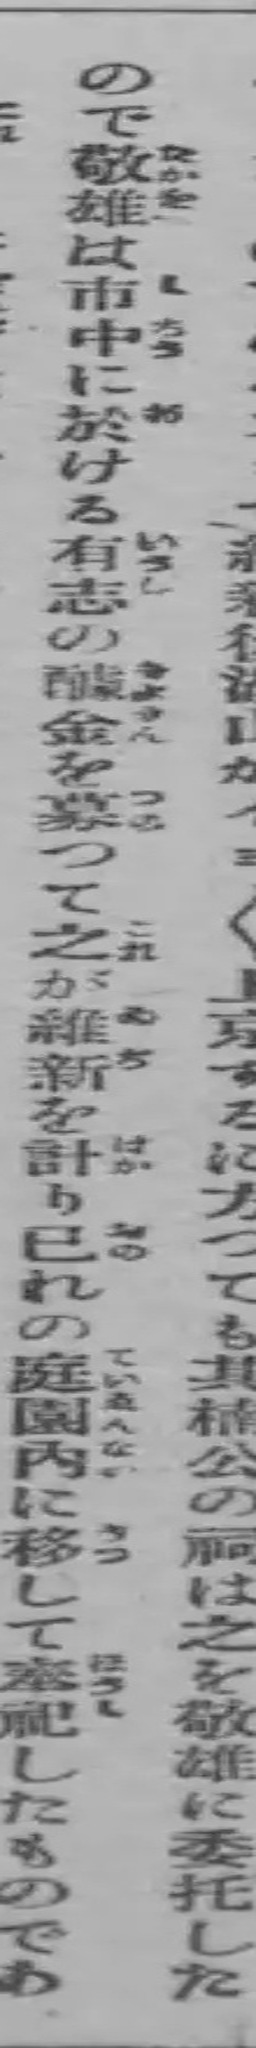ので敬雄は市中に於ける有志の醵金を募つて之が維新を計り己れの庭園内に移して奉祀したものであ
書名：豊橋市史談
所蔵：国立国会図書館 National Diet Library, JAPAN
